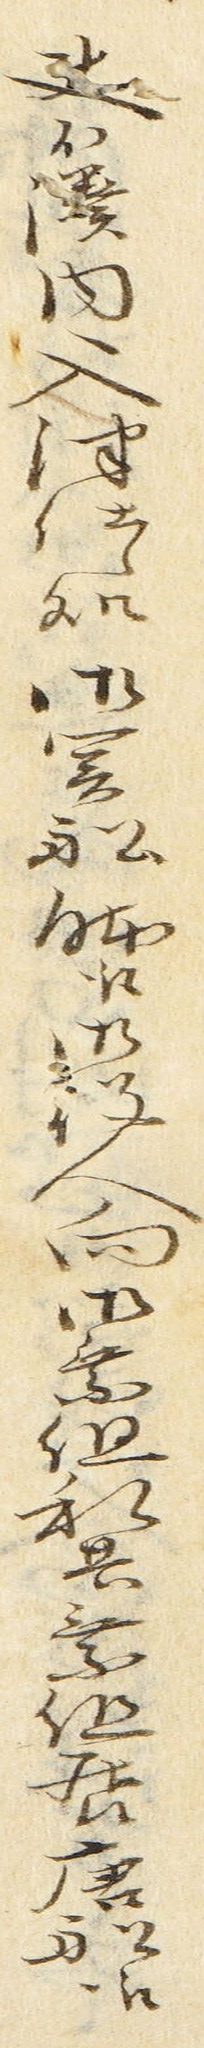延湊内へ入津仕候処御関船躰江御役人向御乗組私共乗組居候唐船江
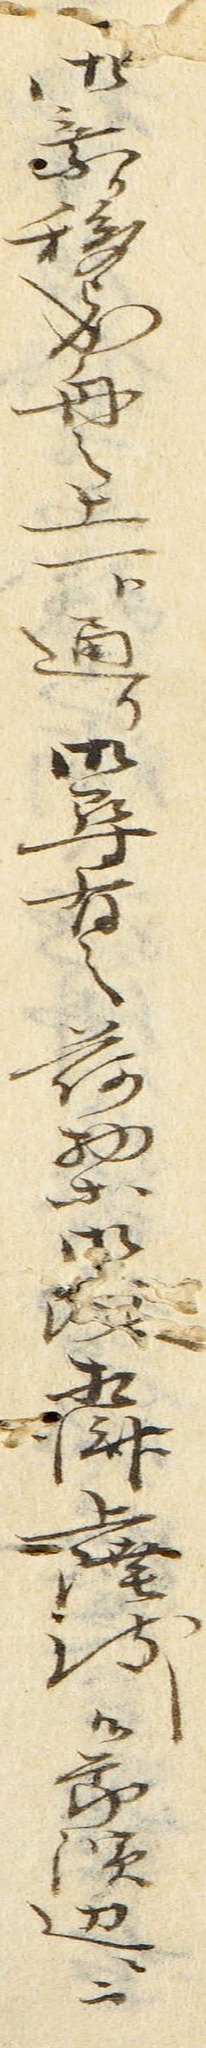御乗り移と成舟之上一ト通り御尋有之荷物等御改相済上陸致し候節浜辺に而

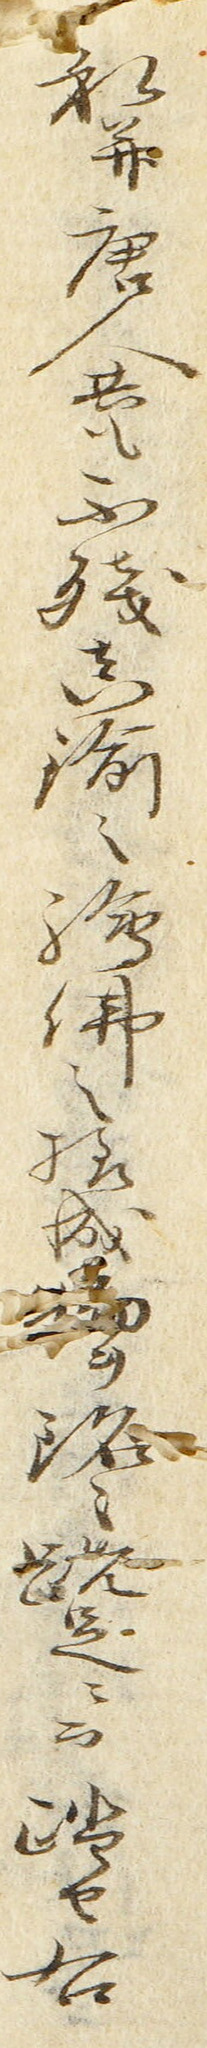私並唐人共不残其諭之絵仏之様成？ヲ？？？足に而踏セ右
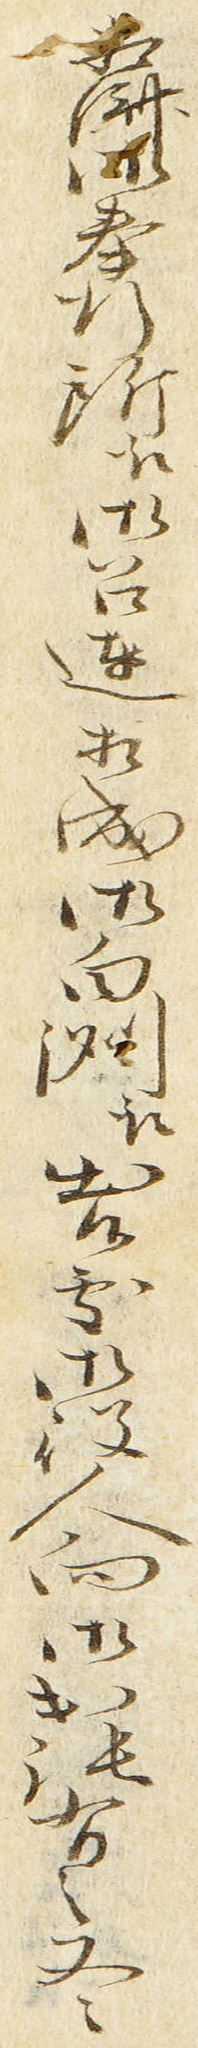相済御奉行所江御召連相成御白洲江出候處御役人向御出張有之又又
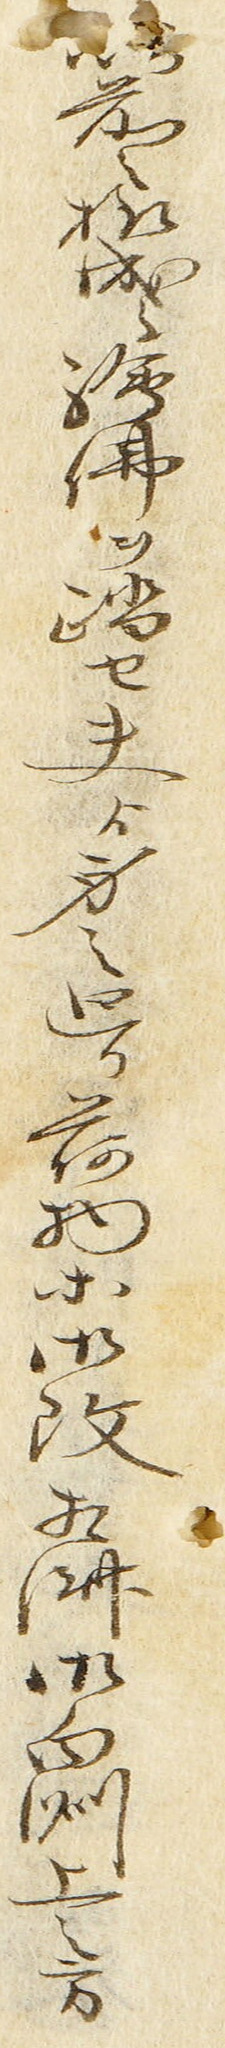？前之様成る絵仏ヲ踏セ夫ゟ身之廻り荷物等御改相済御白洲上之方
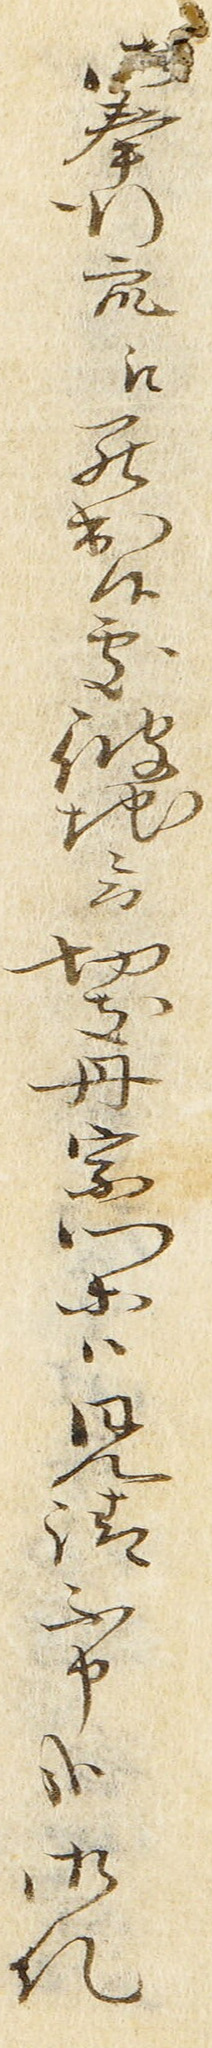御奉行衆江罷出候處彼地二而切支丹宗門等ハ見請不申哉お糺
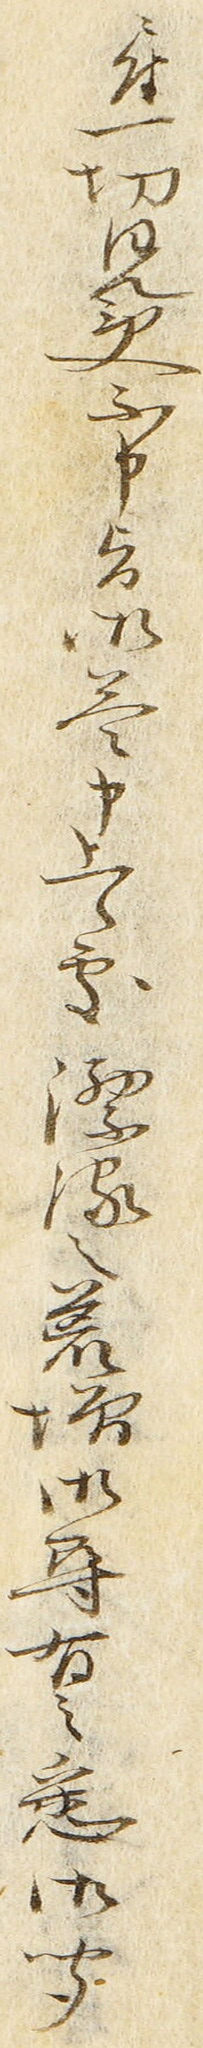二付一切見受不申旨御答申上候處漂流之荒増御尋有之悉御聞
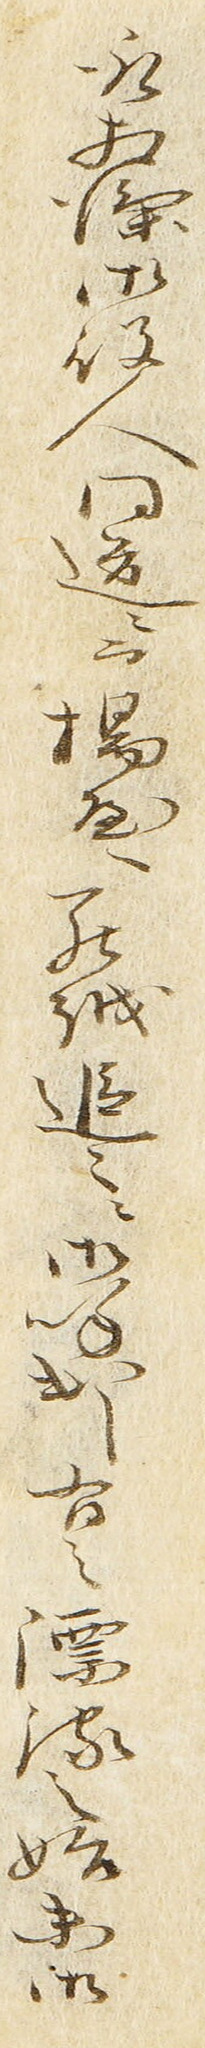取相済御役人同道に而揚屋へ罷越追々に御呼出し有之漂流之始末御
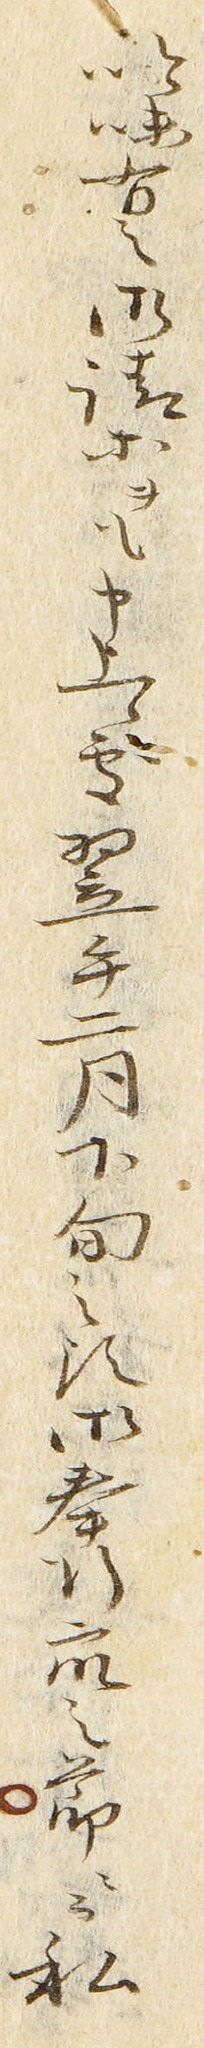吟味有之御請等ヲも申上候處翌午二月下旬之頃御奉行衆の節に而私
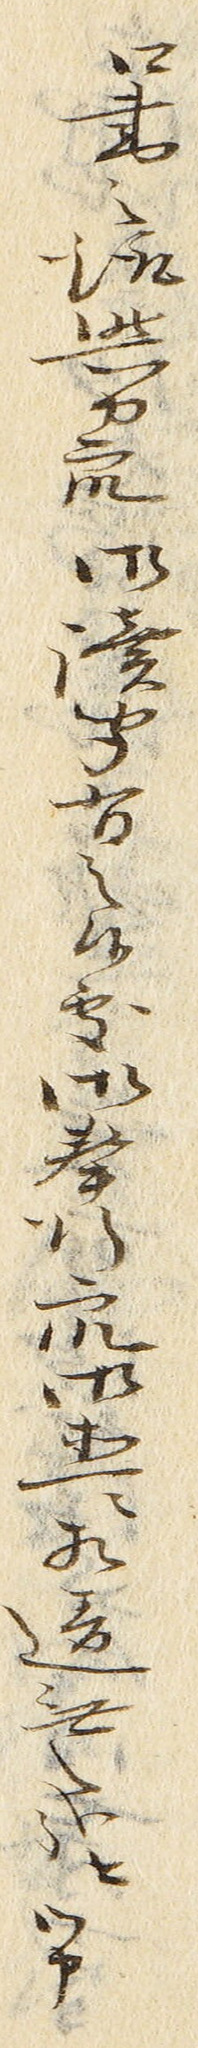口書之趣与力衆御読聞有之候處御奉行衆御尋ニ相違無候哉と御申
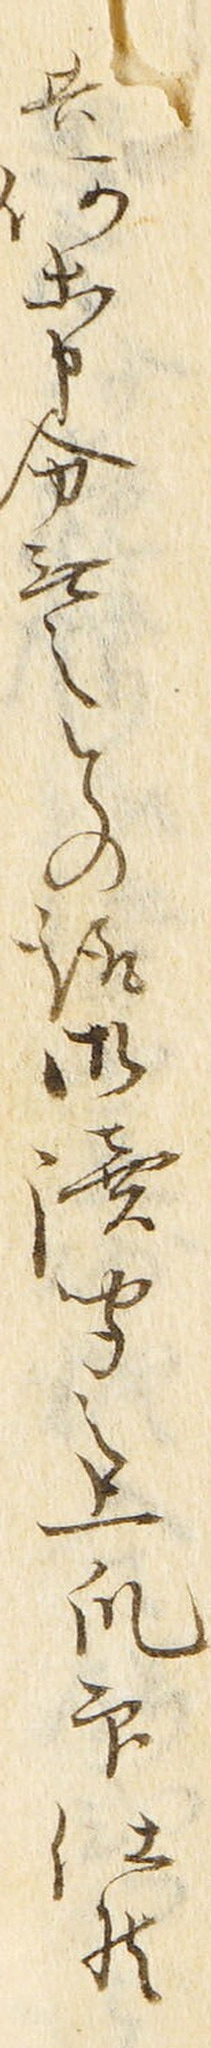共何等申分無之との様御読聞之上爪印仕候
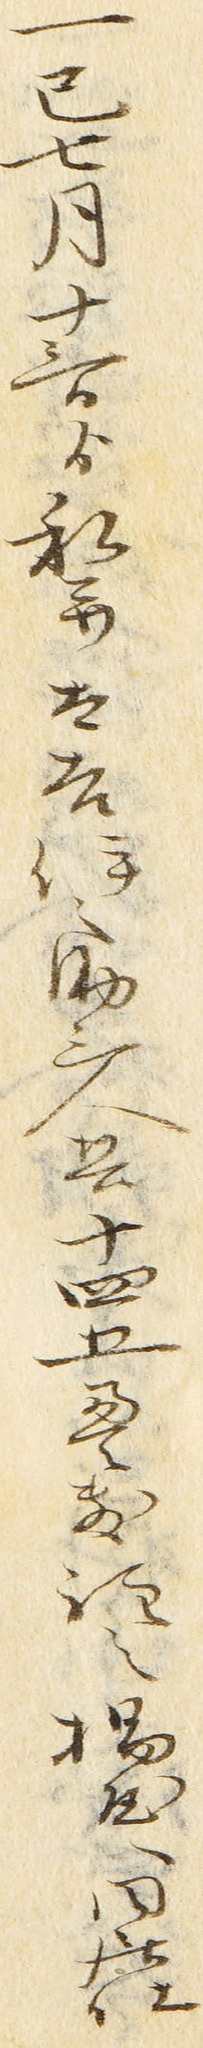一巳七月十三日ゟ私共太吉伊之助三人共十四五畳敷程之揚屋へ？居仕
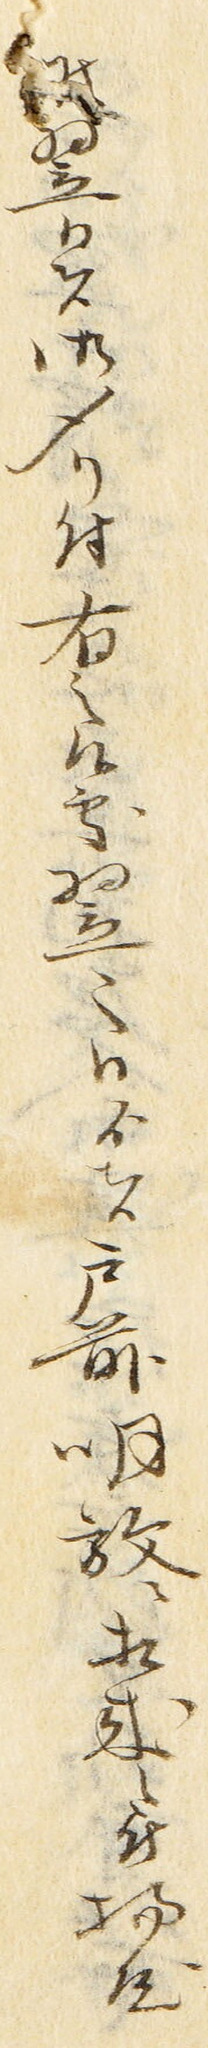？翌日は御〆り付有之候處翌々日ゟは戸前明放に相来に付揚屋
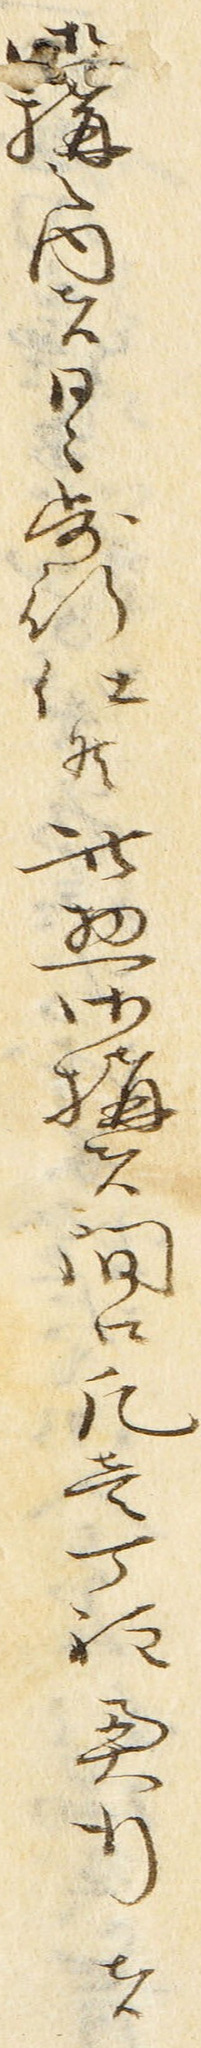御構之内は日々歩行仕候此惣御構は間口凡壱丁程奥行は
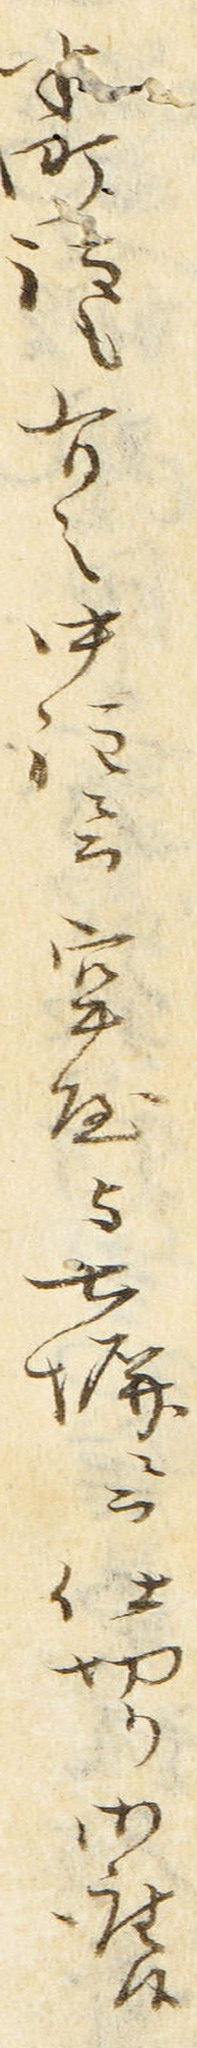半町程も有之中程に而空家と土塀に而仕切り御座候
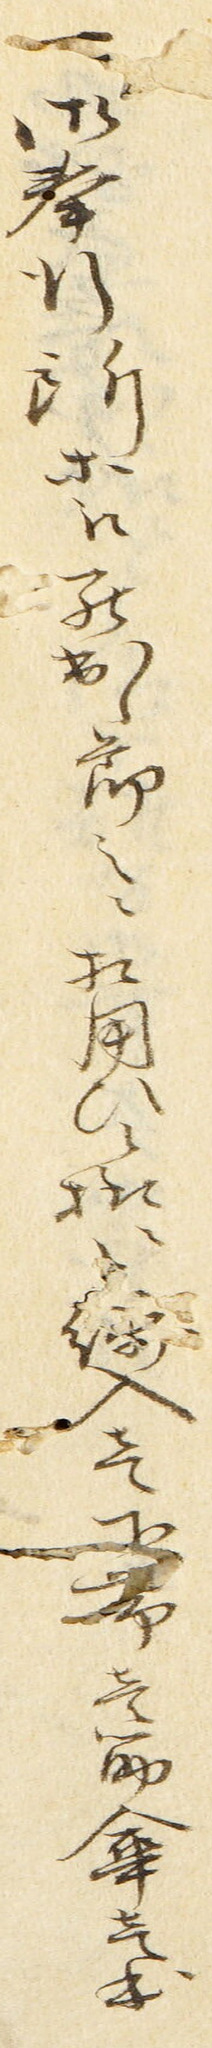一御奉行所等江罷出候節之に相用ひ候様？入壱下帯壱筋傘壱本
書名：漂流人弥市之記
